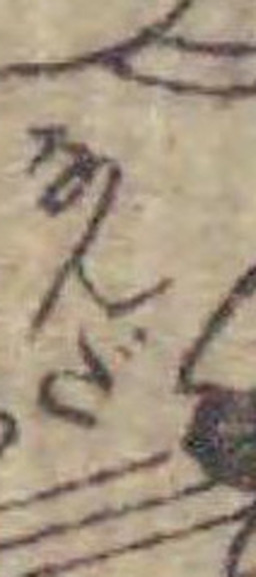なんだ
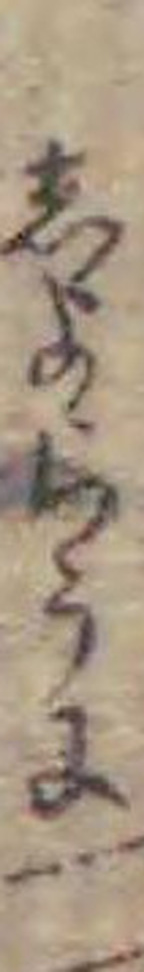しよらうに
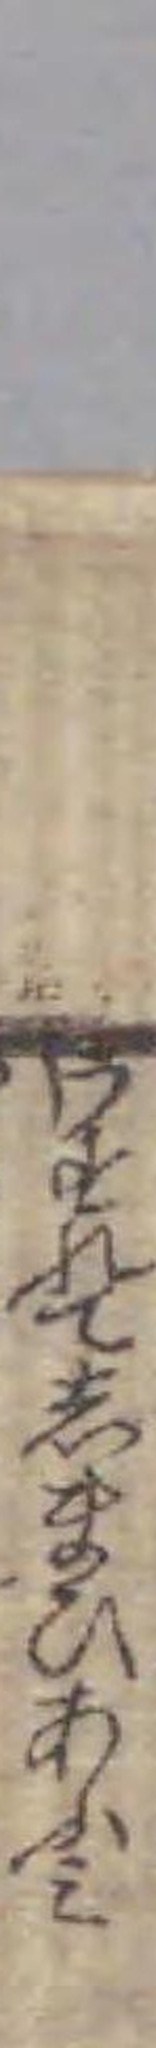わすれてしまひあふみ
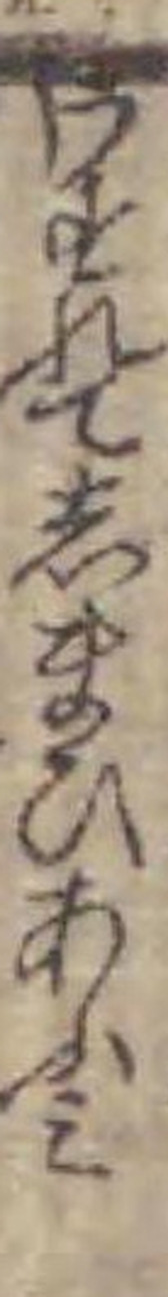わすれてしまひあふみ
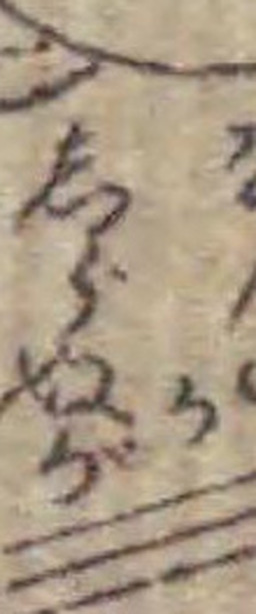しらぬが
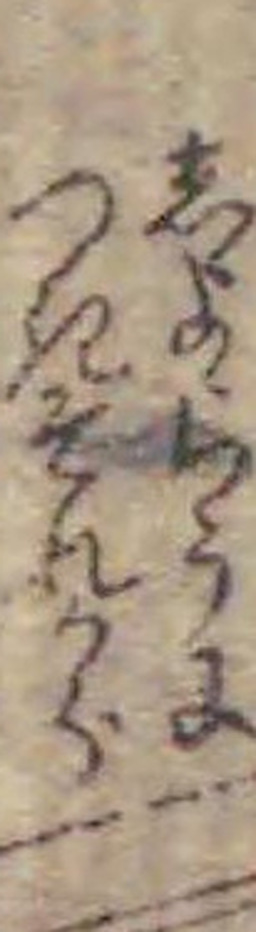つきそれから
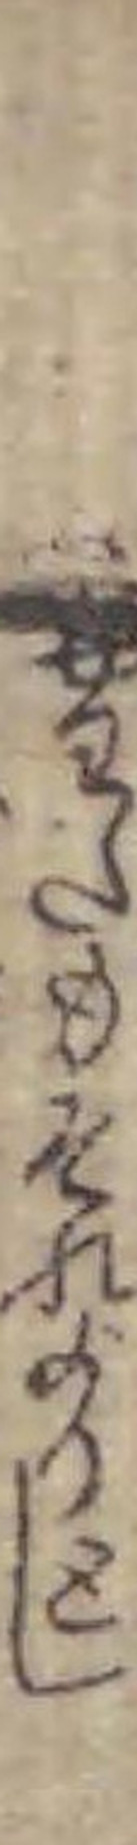やわたもそれよりとし
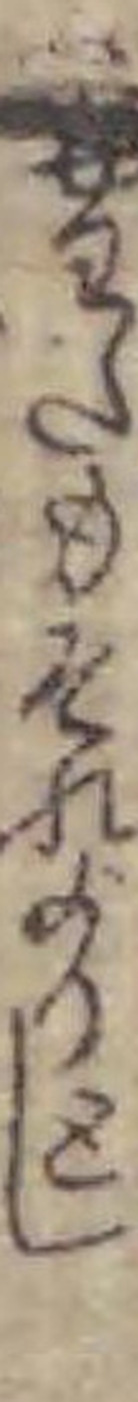やわたもそれよりとし
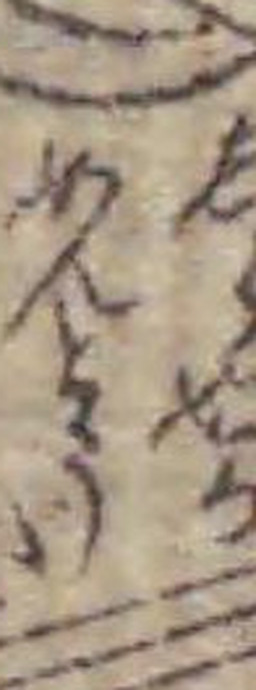めんとう
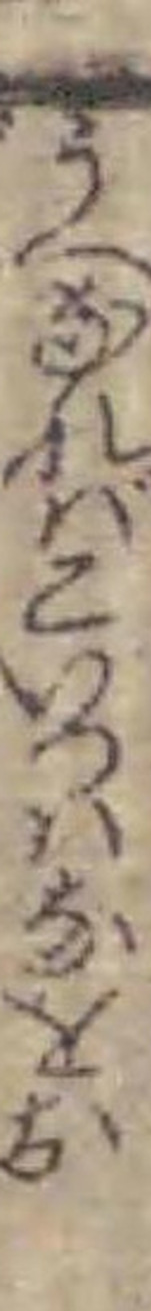うへなればこいつはなをお
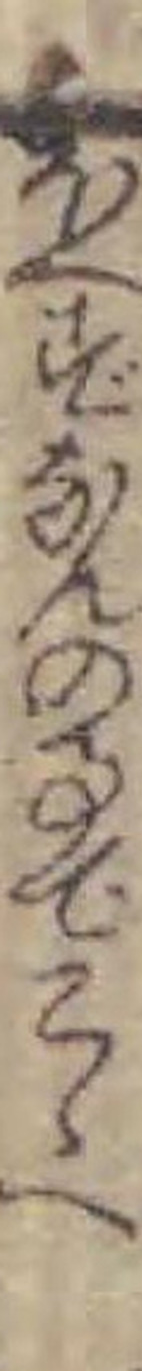ぼへずなんの事でこゝへ
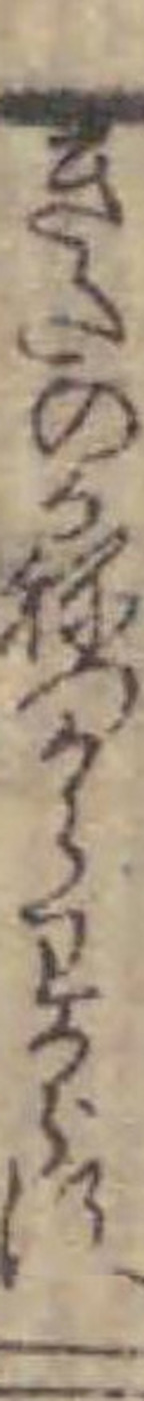きたのかねつからわからす
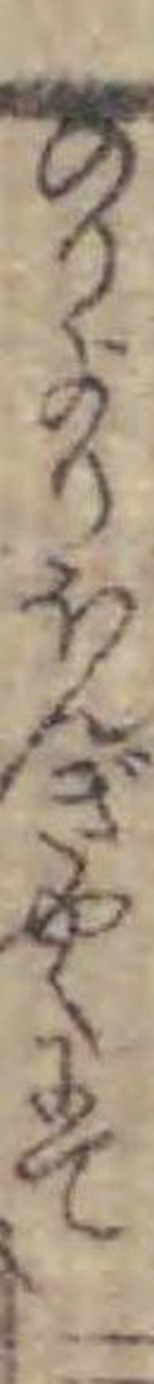のりよりほんぎやくにて
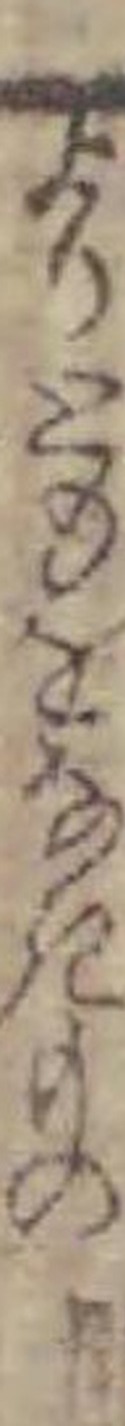よりともをなきもの
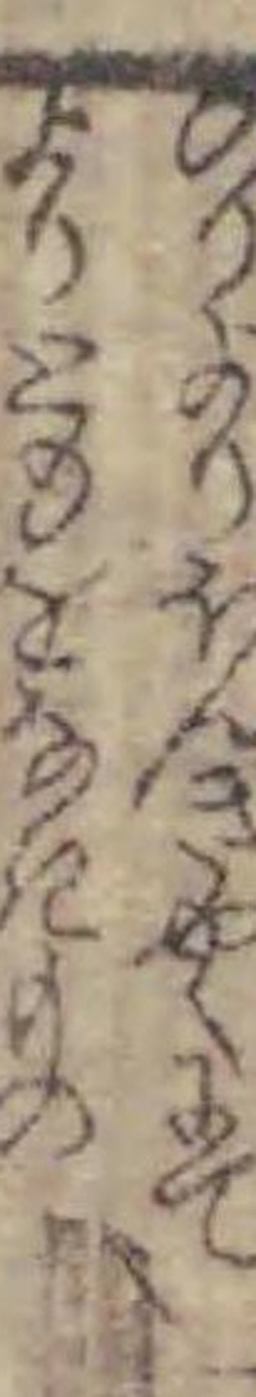よりともをなきもの
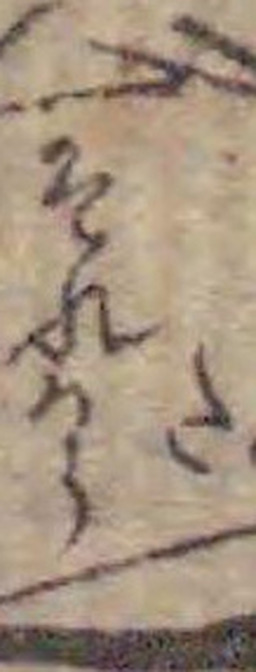それから
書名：年寄之冷水曽我 : 3巻
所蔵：国立国会図書館 National Diet Library, JAPAN
